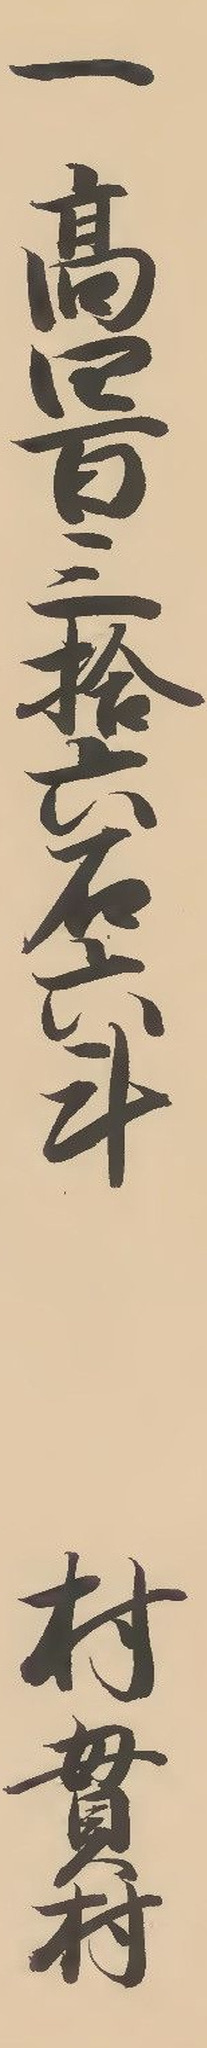一高四百三拾六石六斗村貫村
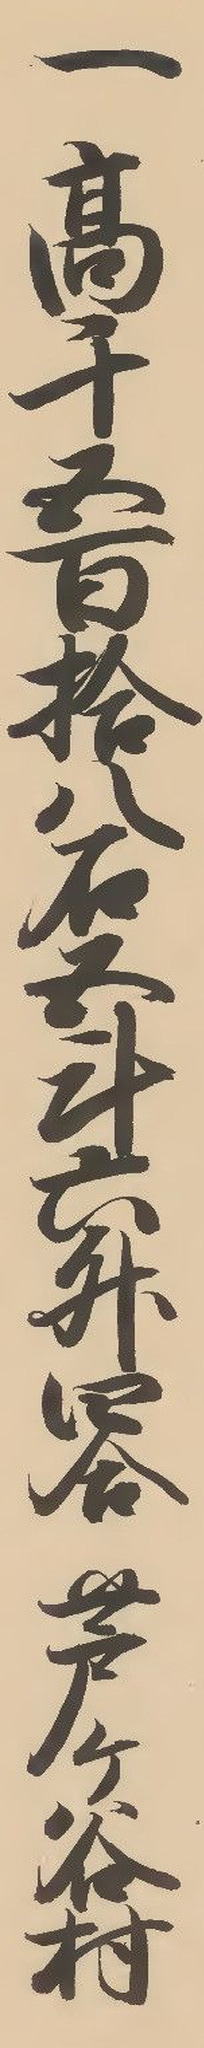一高千五百拾八石五斗六升四合芦ヶ谷村
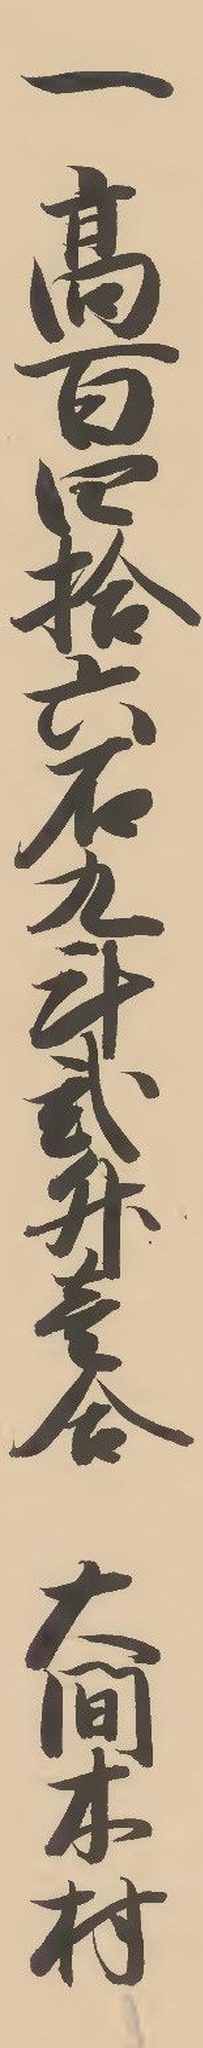一高百四拾六石九斗弐升壱合大間木村
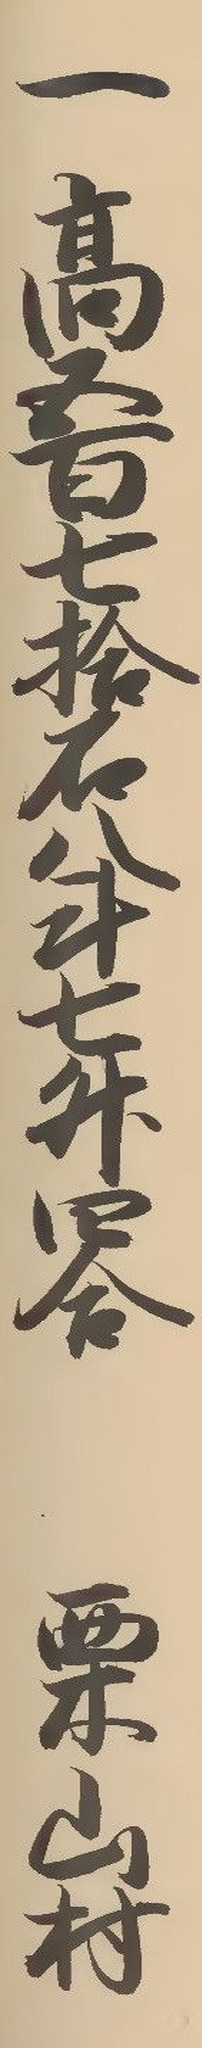一高五百七拾石八斗七升四合栗山村
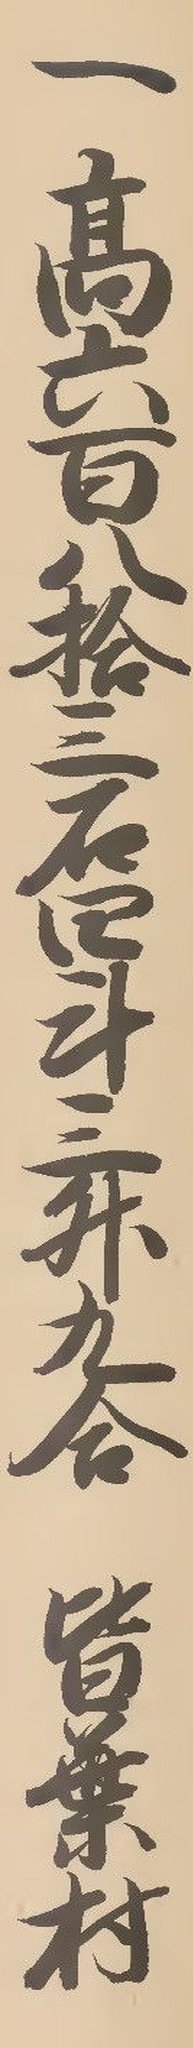一高六百八拾三石四斗三升九合皆葉村
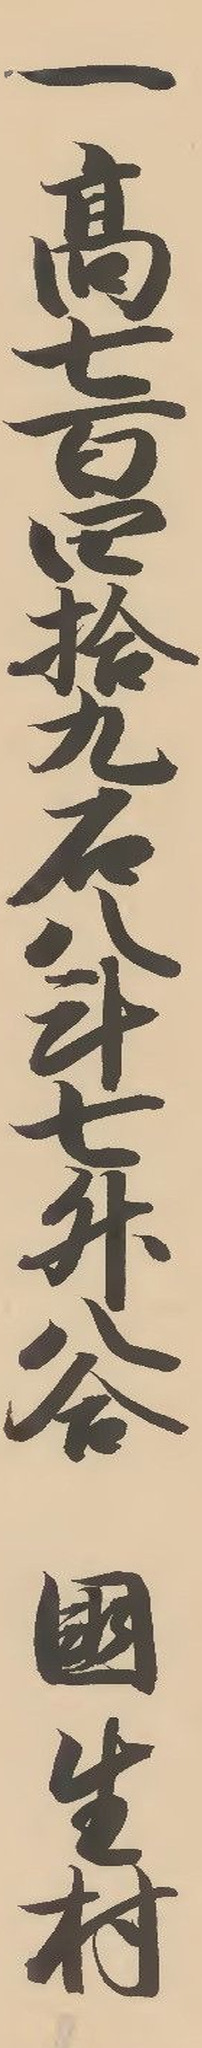一高七百四拾九石八斗七升八合国生村
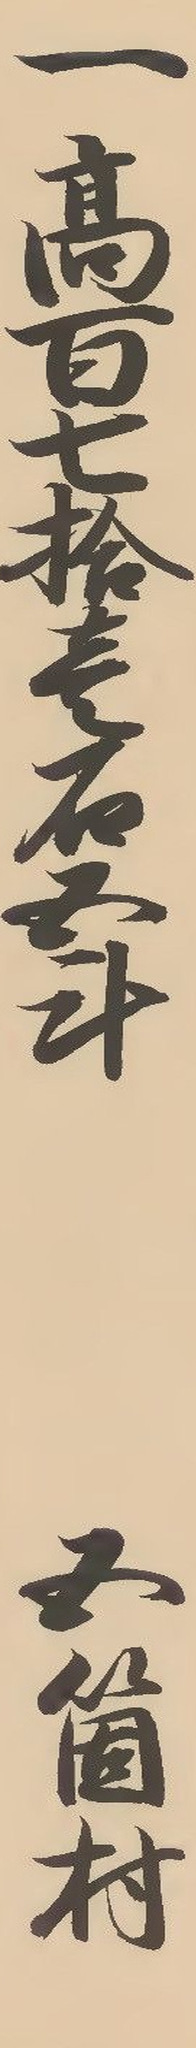一高百七拾壱石五斗五箇村

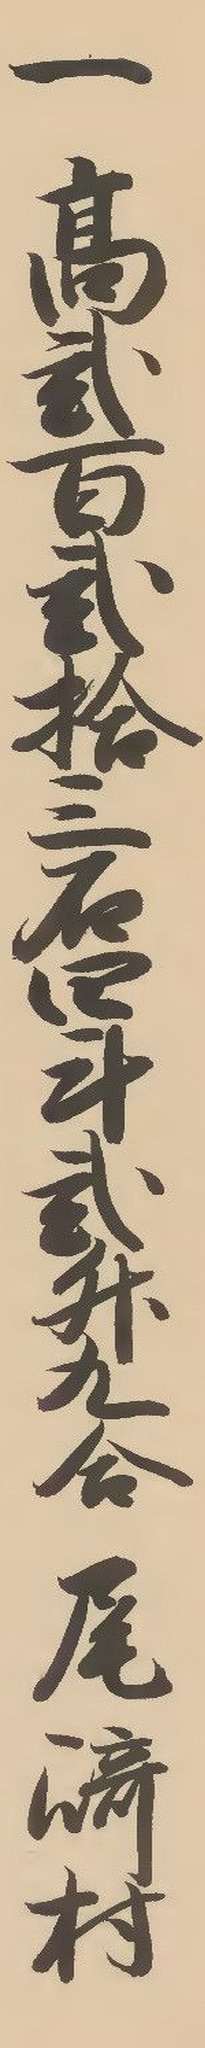一高弐百弐拾三石四斗弐升九合尾崎村
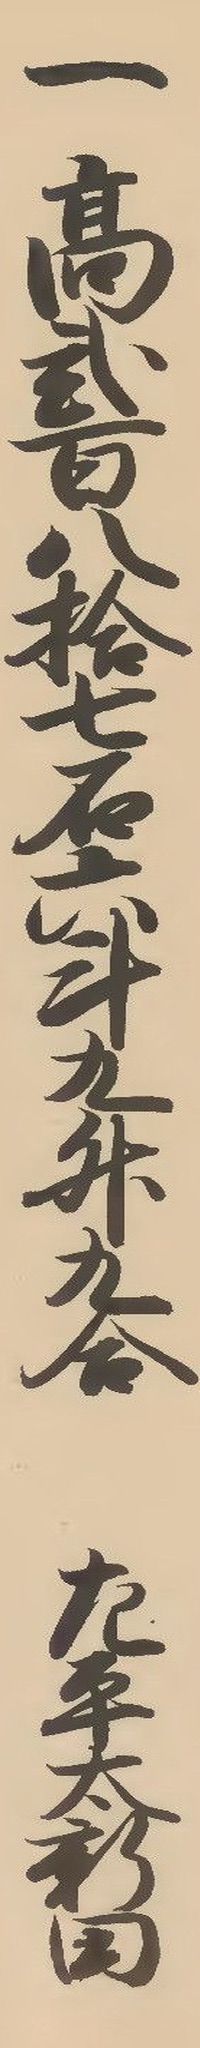一高弐百八拾七石六斗九升九合左平太新田
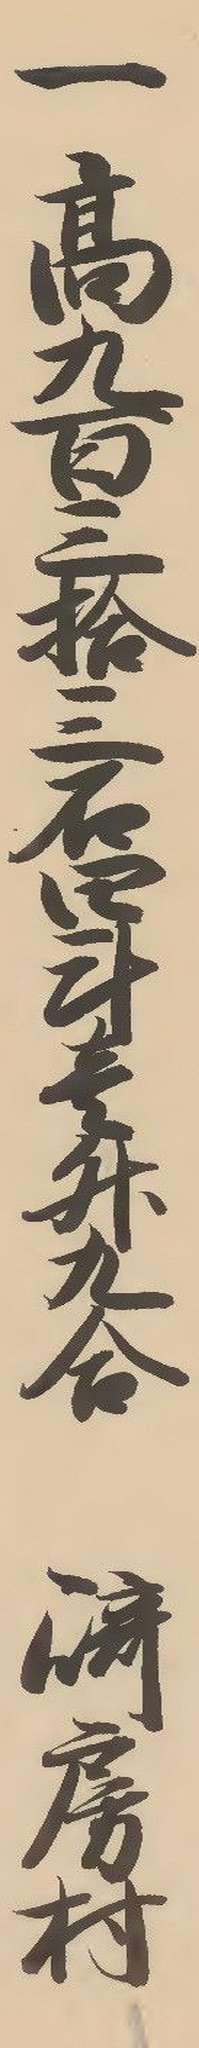一高九百三拾三石四斗壱升九合崎房村
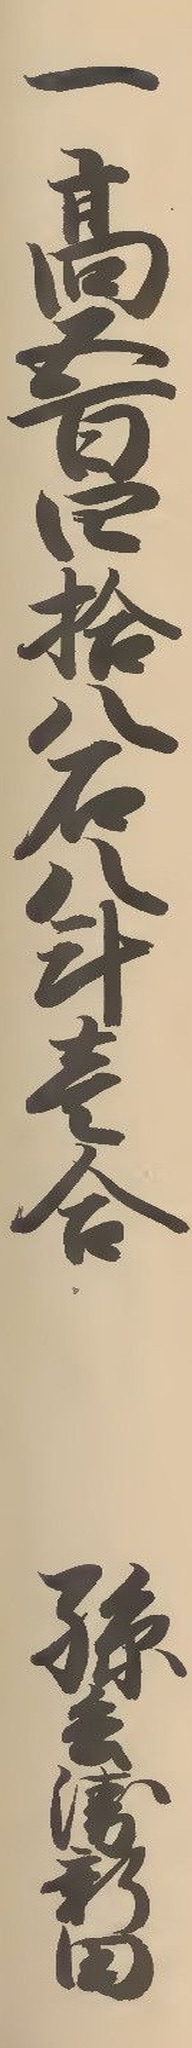一高五百四拾八石八斗壱合孫兵衛新田
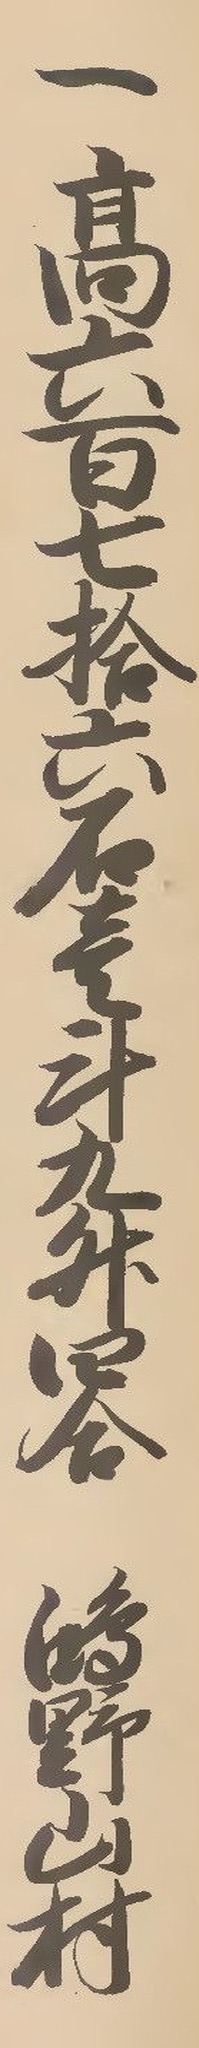一高六百七拾六石壱斗九升四合鴻野山村
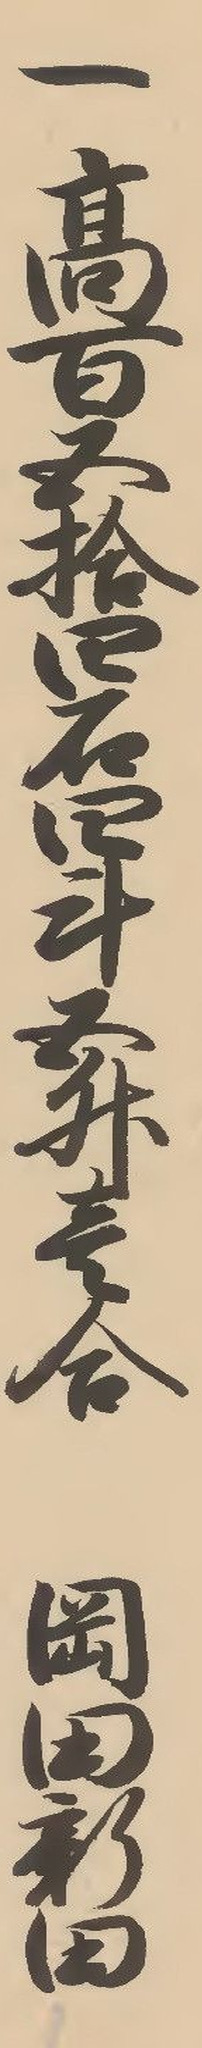一高百五拾四石四斗五升壱合岡田新田
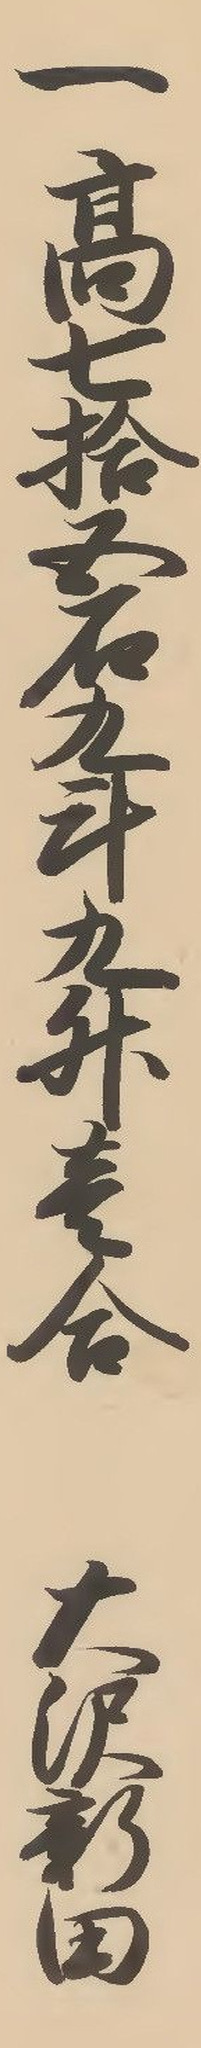一高七拾五石九斗九升壱合大沢新田
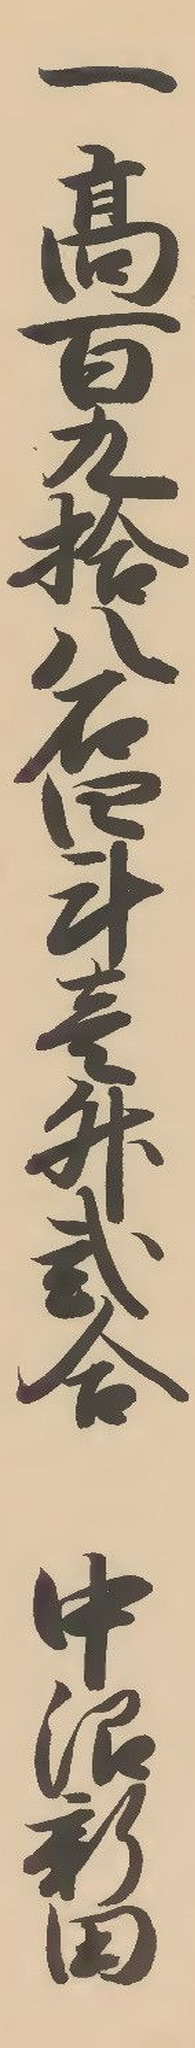一高百九拾八石四斗壱升弐合中沼新田

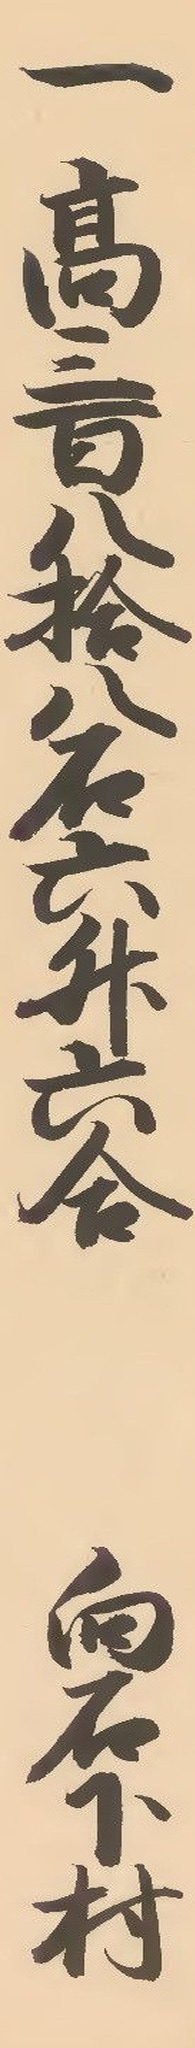一高三百八拾八石六升六合向石下村
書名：下総国郷帳
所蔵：国立公文書館 National Archives of Japan
